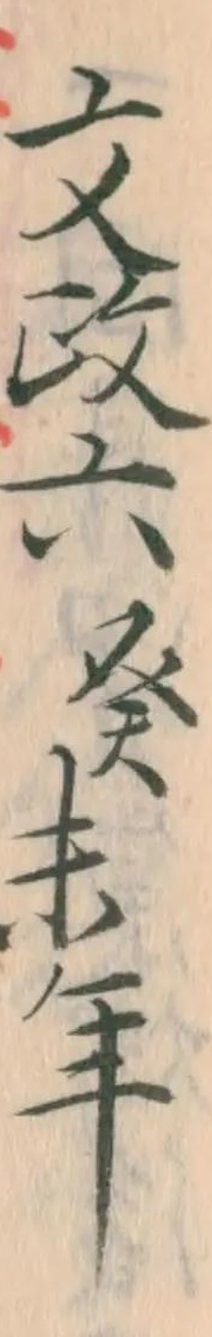文政六癸未年
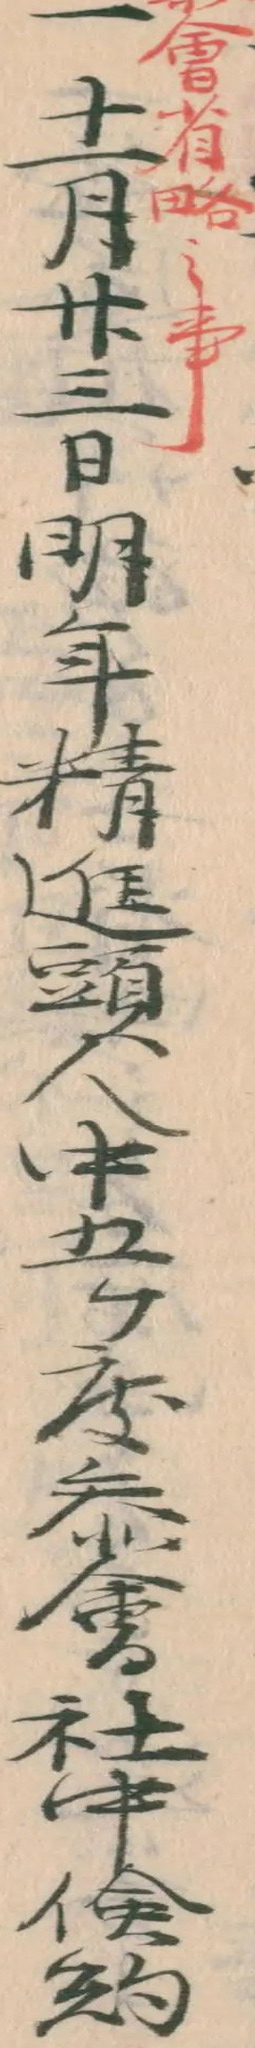一十一月廿三日明年精進頭人中五ケ度参會社中倹約
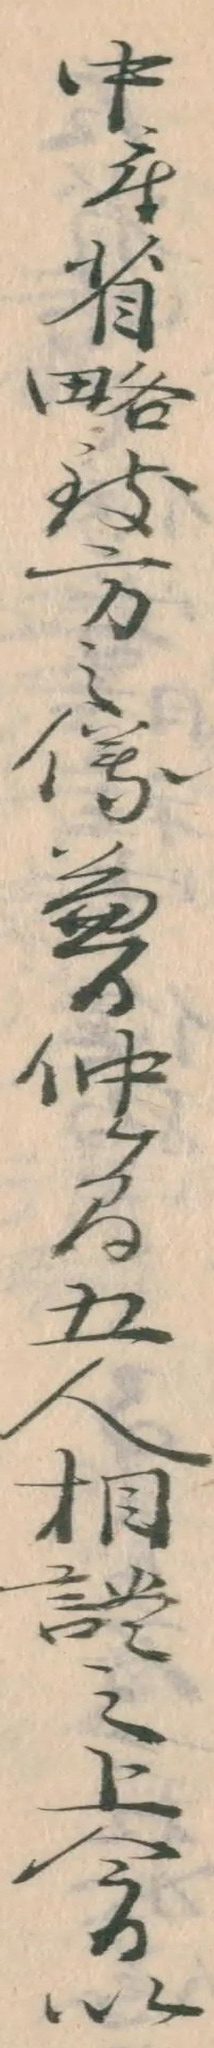中ニ付省略致方之儀兼而仲ケ間五人相談之上今日以
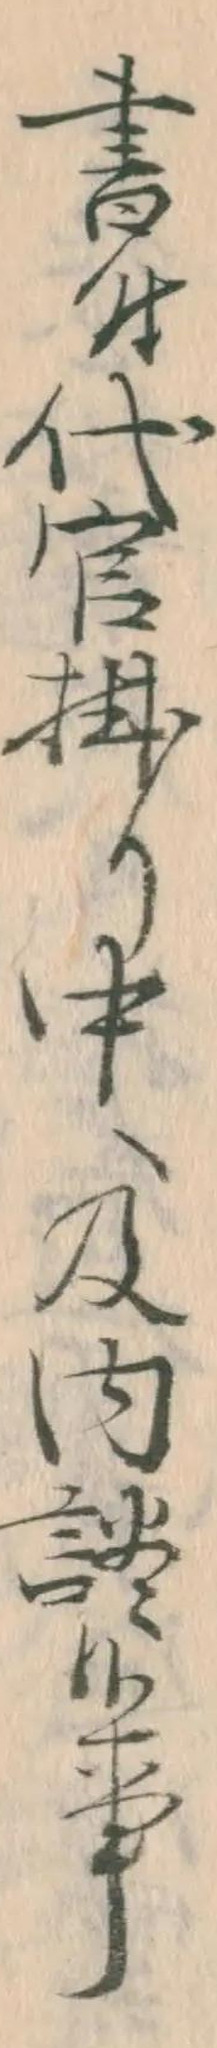書付代官掛リ中へ及内談候事
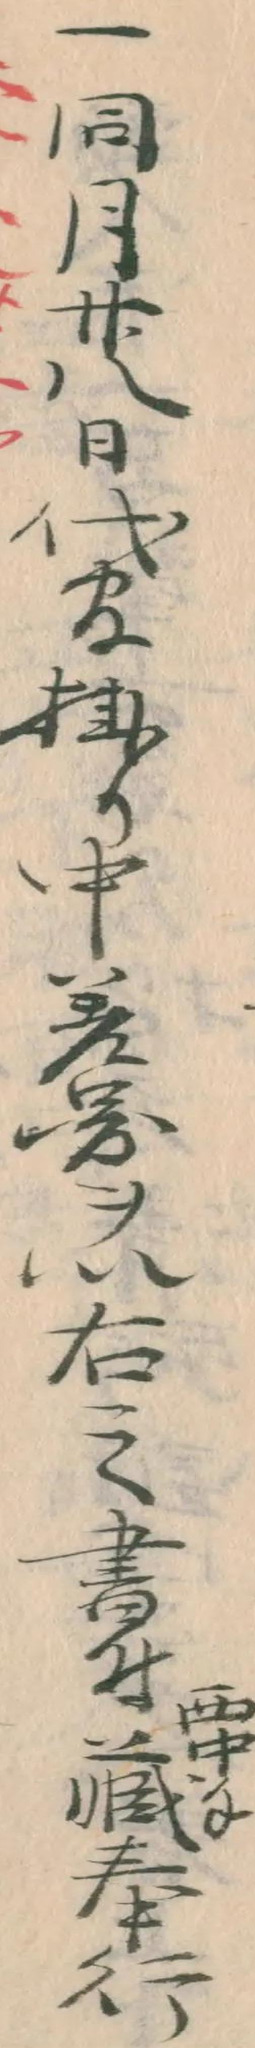一同月廿八日代官掛リ中差図ヲ以右之書付西中手蔵奉行
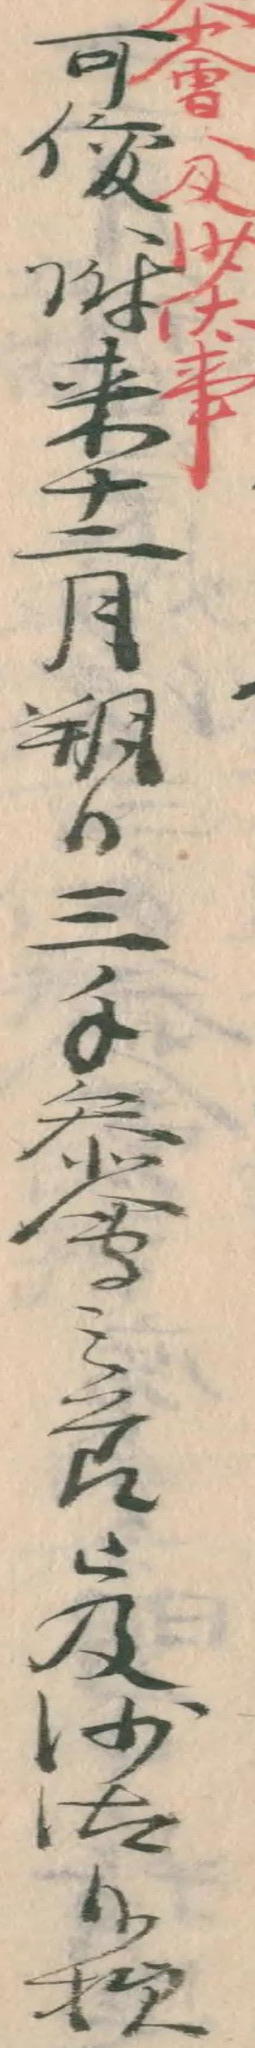可俊ヘ附来十二月朔日三手参會之節被及沙汰候様
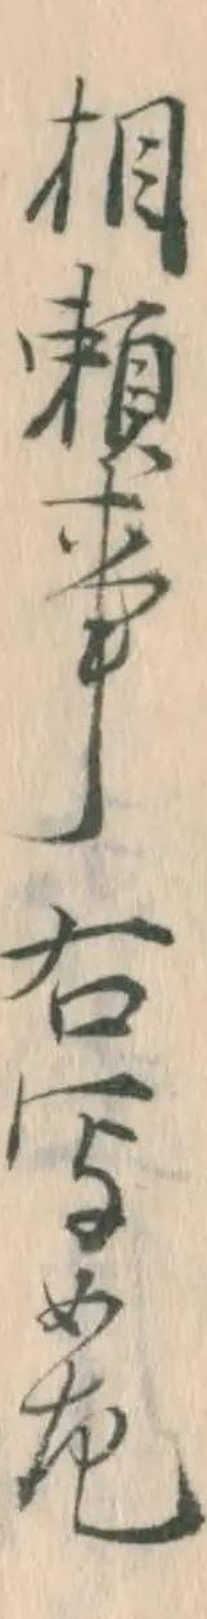相頼事右写如左
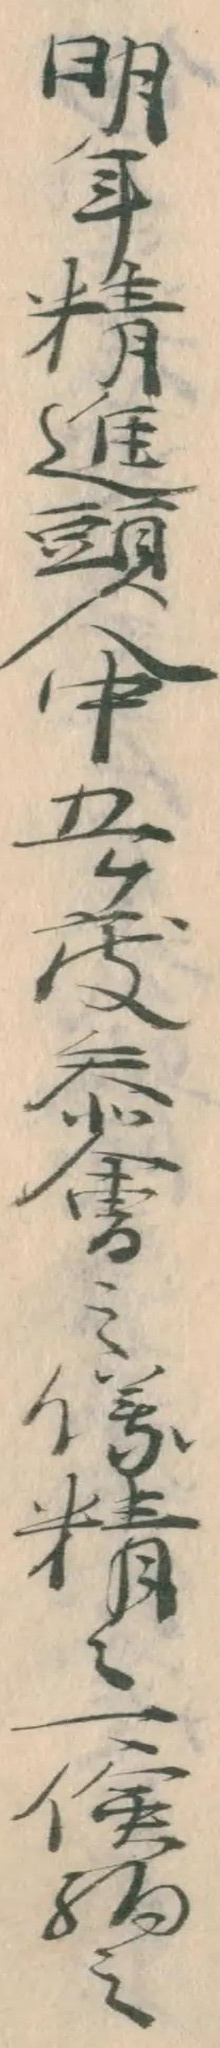昨年精進頭人中五ケ度参會之儀精々可倹約之
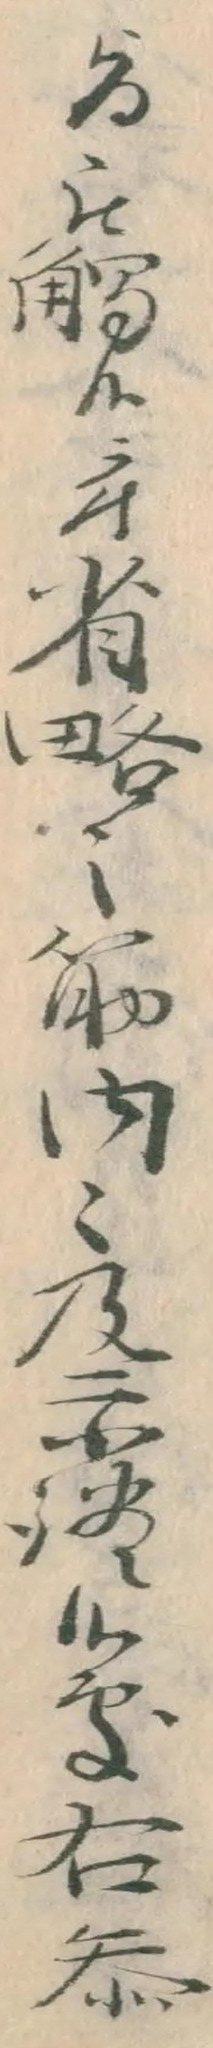旨被触候ニ付省略之筋内々及示談候處右参
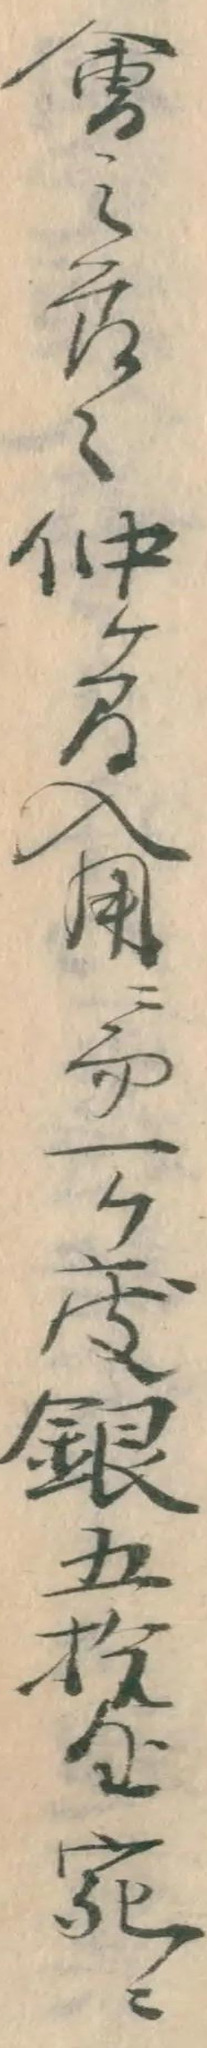會之節々仲ヶ間入用ニ而一ヶ度銀五拾匁宛ニ

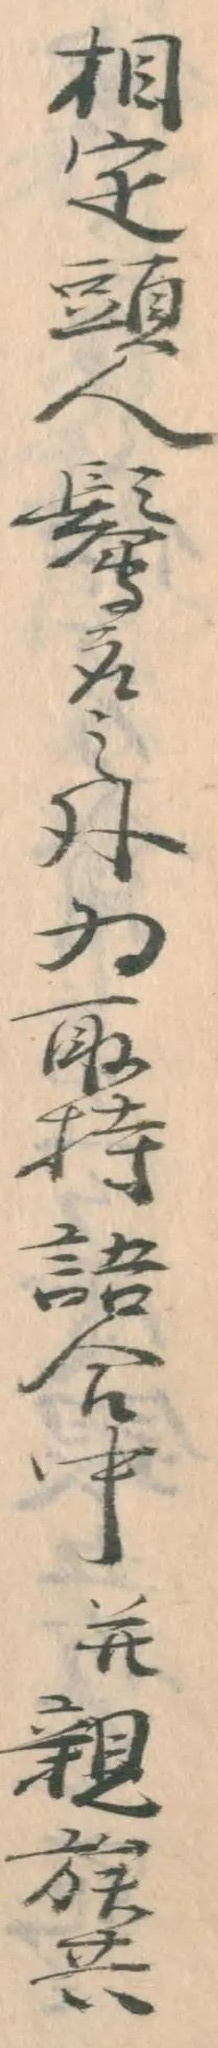相定頭人鬠取之外為取持語合中并親族共
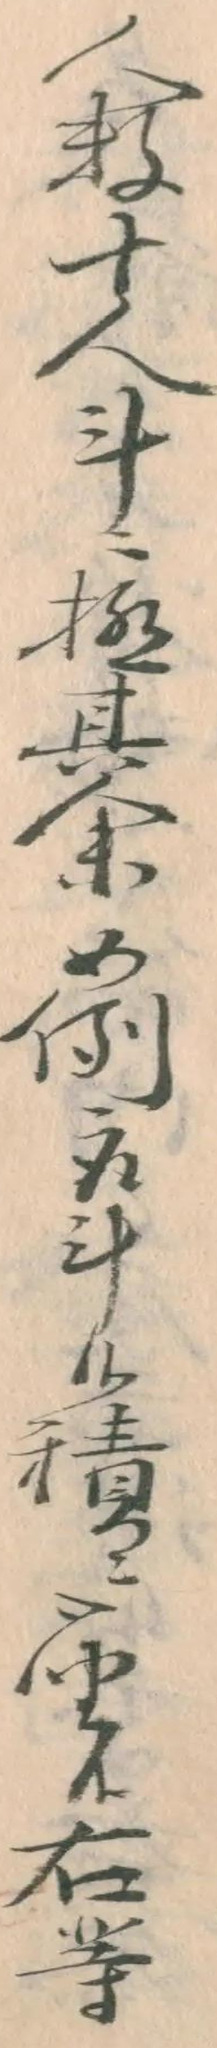人数十人斗ニ極其余如例取斗候積ニ御座候右等
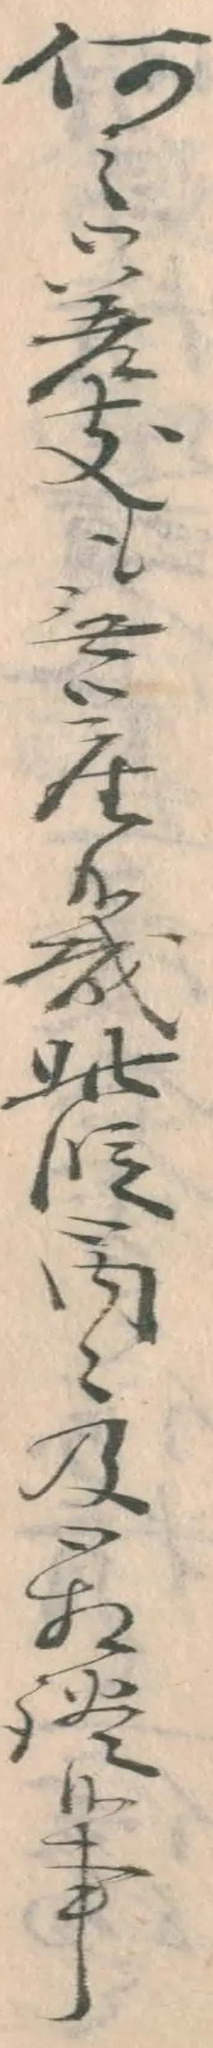何之御差支も無御座候哉此段御内々及御相談候事
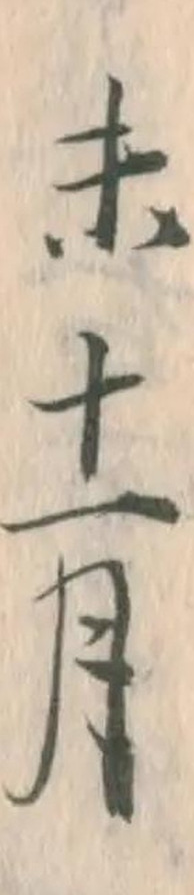未十一月
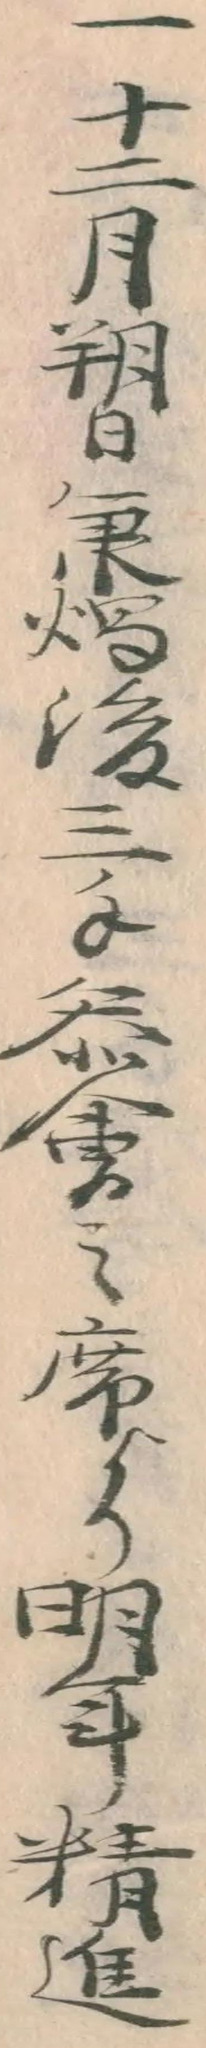一十二月朔日秉燭後三手参會之席より明年精進
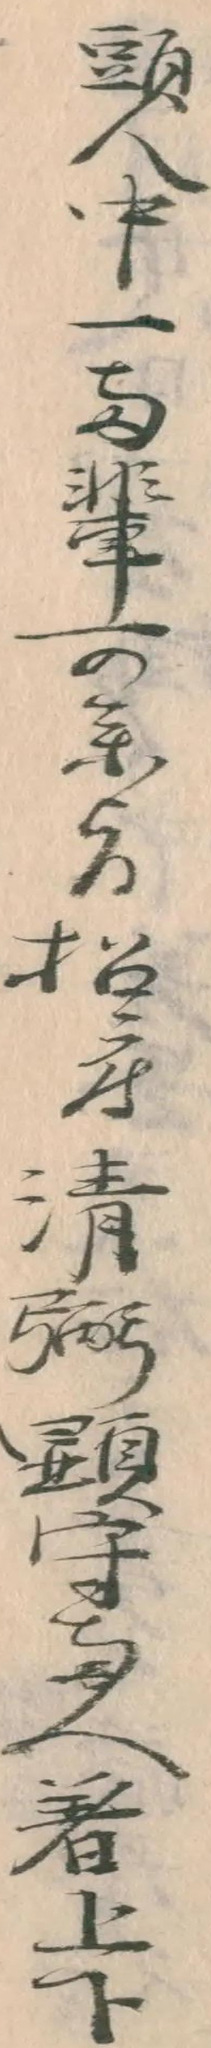頭人中一両輩可参旨招ニ付清弼顕守両人着上下
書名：賀茂社記録. 第72冊
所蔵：国立国会図書館 National Diet Library, JAPAN
